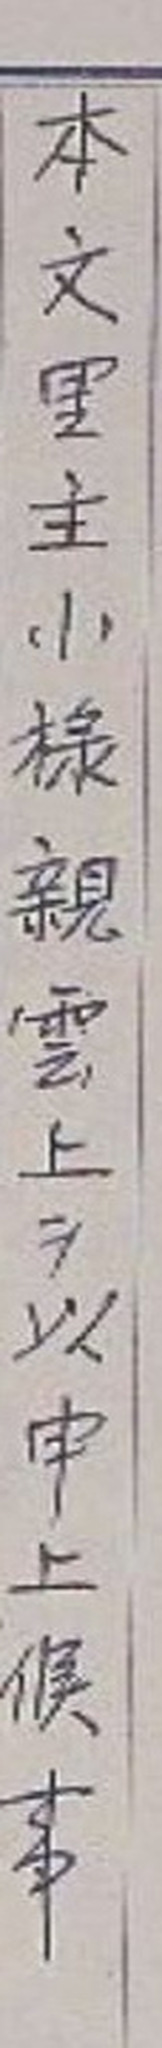本文里主小禄親雲上を以申上候事
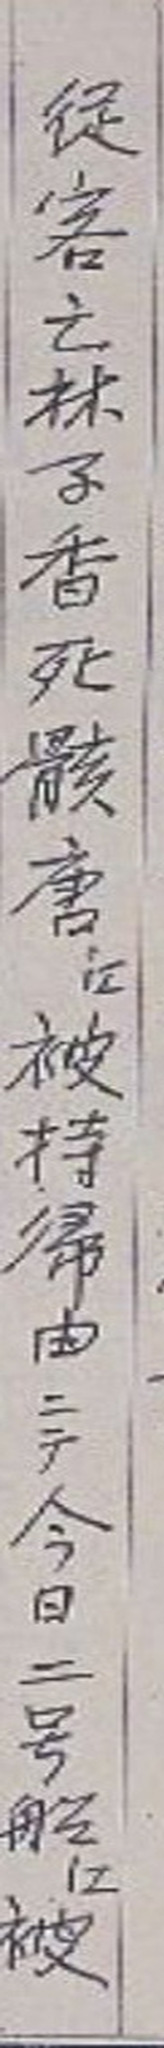従客亡林子香死骸唐え被持帰由にて今日二号船え被
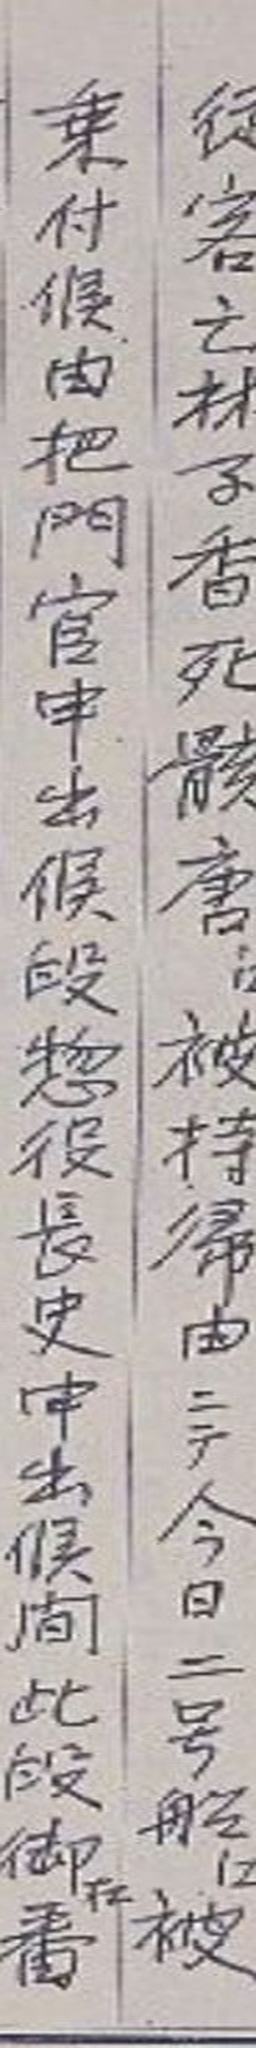乗付候由把門官申出候段惣役長史申出候間此段御在番
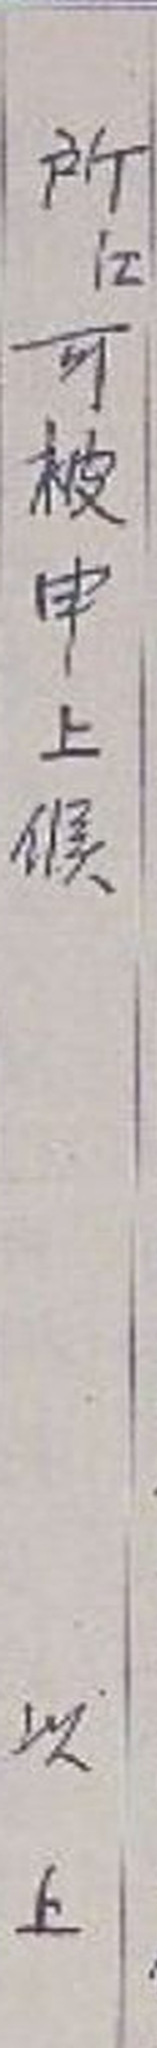所え可被申上候以上
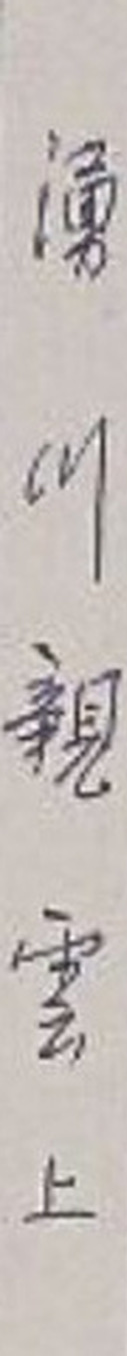湧川親雲上
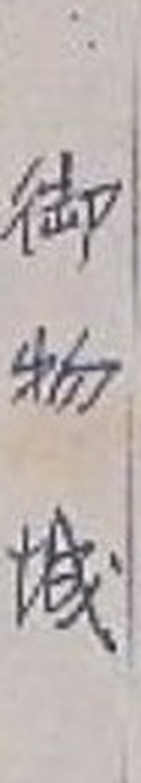御物城
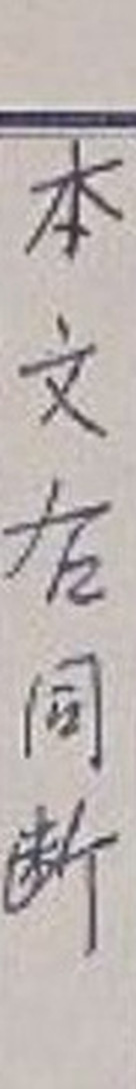本文右同断
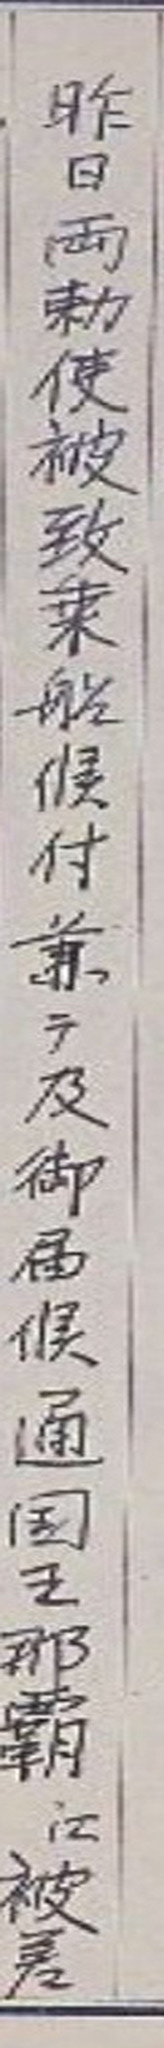昨日両勅使被致乗船候付兼て及御届候通国王那覇え被差
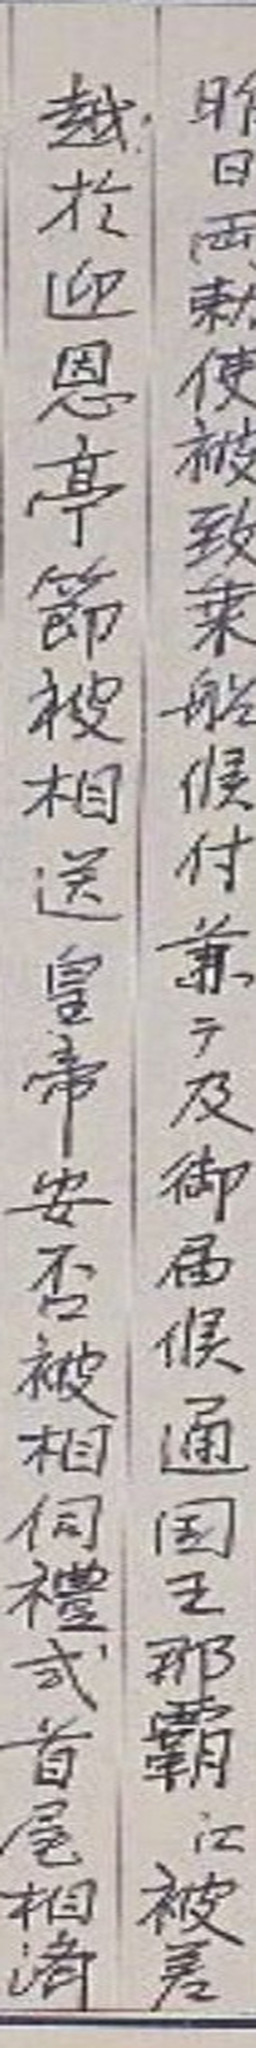越於迎恩亭節被相送皇帝安否被相伺礼式首尾相済
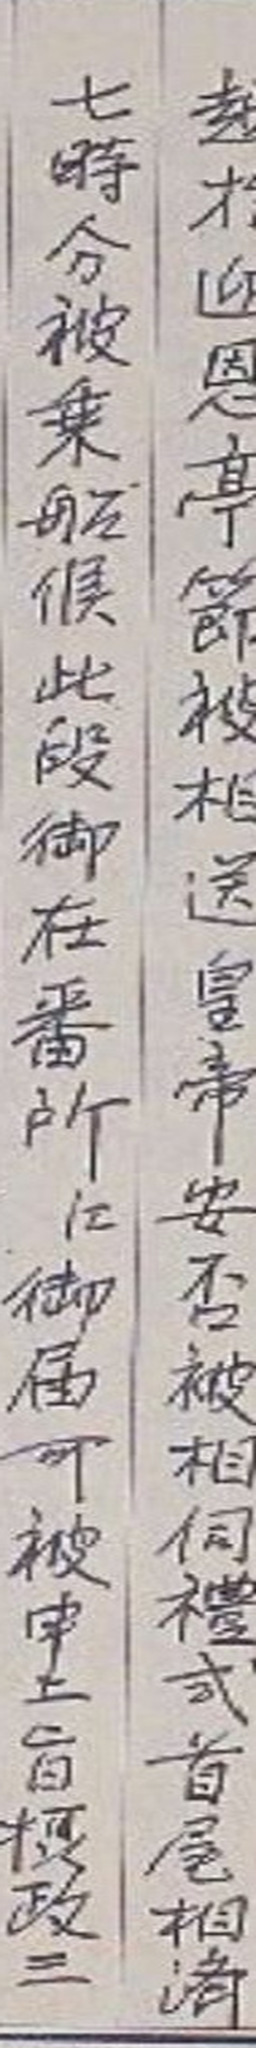七時分被乗船候此段御番所え御届可被申上旨摂政三
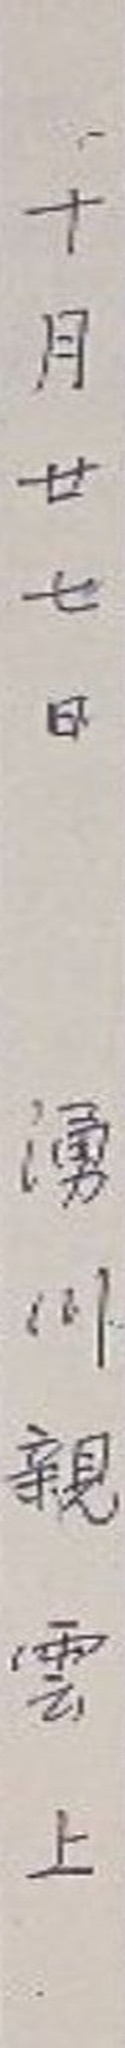十月廿七日湧川親雲上
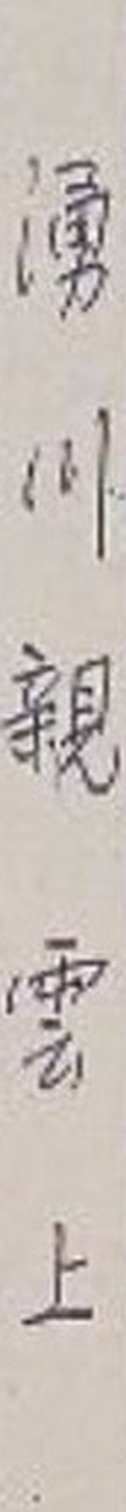湧川親雲上
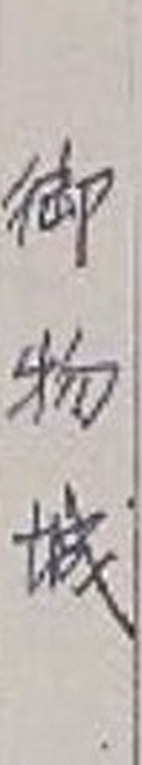御物城
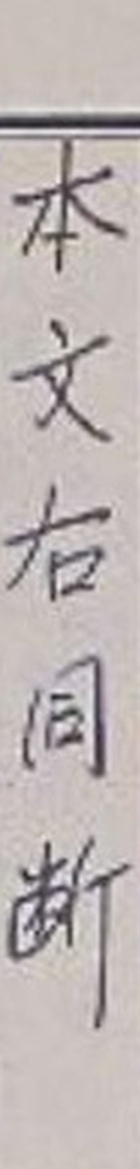本文右同断
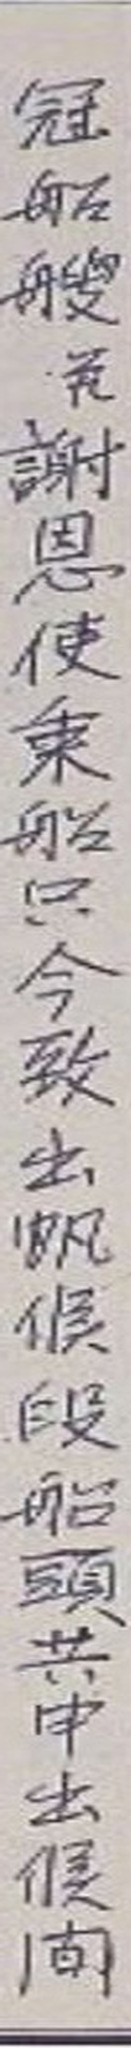冠船艘并謝恩使乗船只今致出帆候段船頭共申出候間
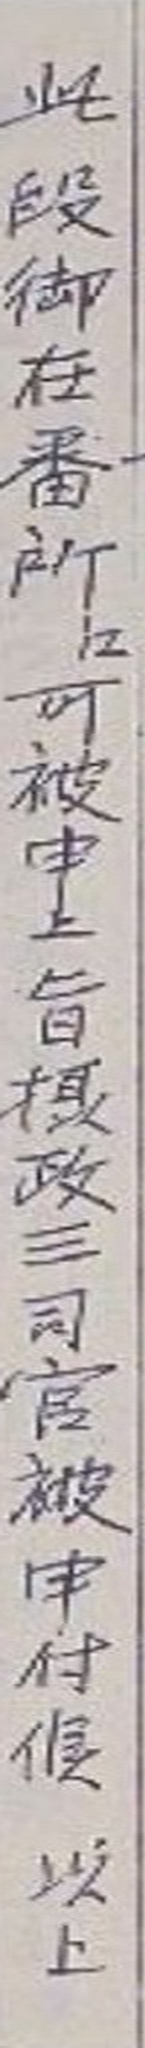此段御番所え可被申上旨摂政三司官被申付候以上
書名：支那冊封使来琉諸記 下巻
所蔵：University of the Ryukyus Library
